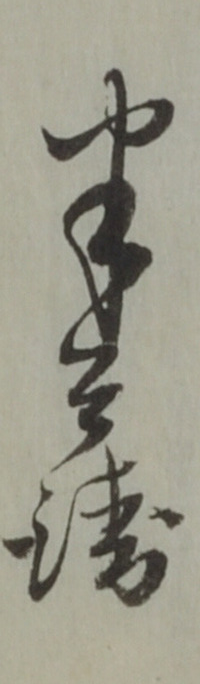半兵衛
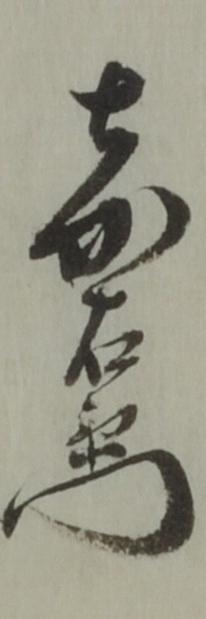嘉右衛門
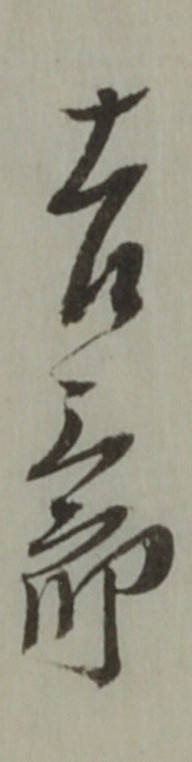吉三郎
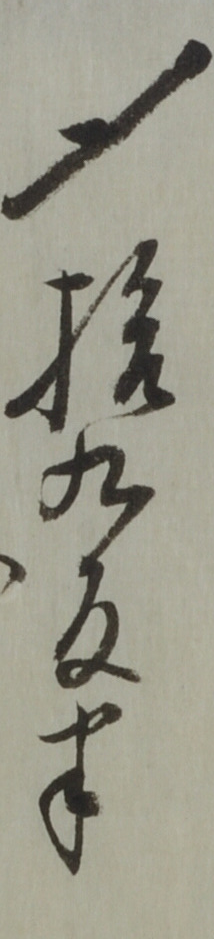〆拾九反半
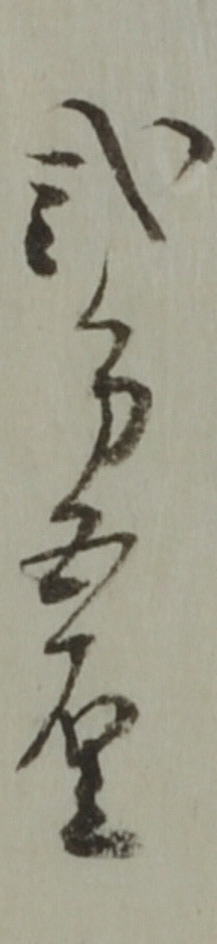弐分五厘
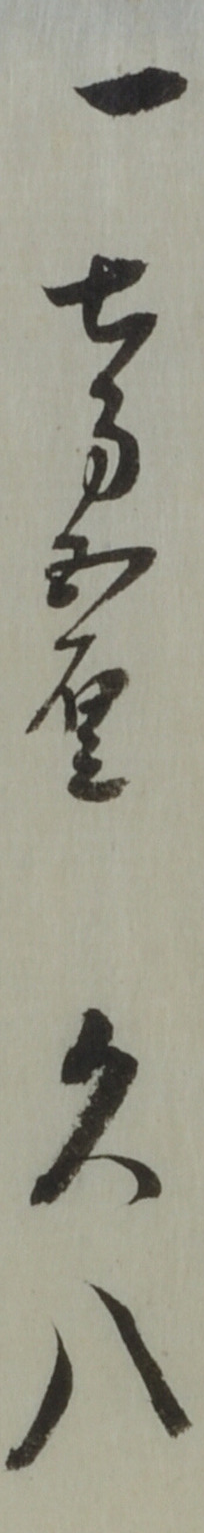一七分五厘久八
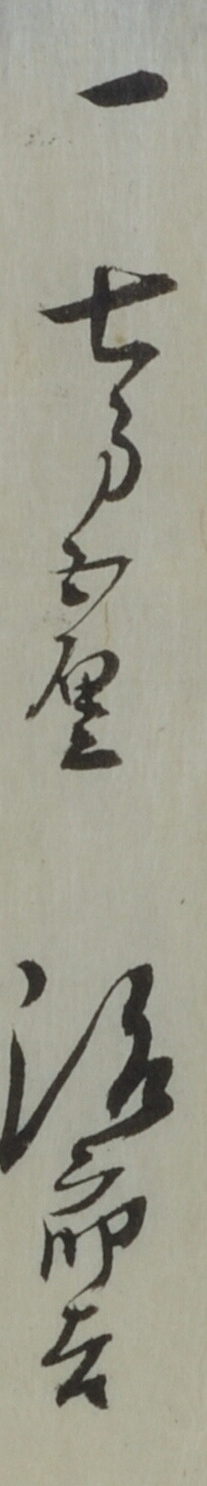一七分五厘治郎吉

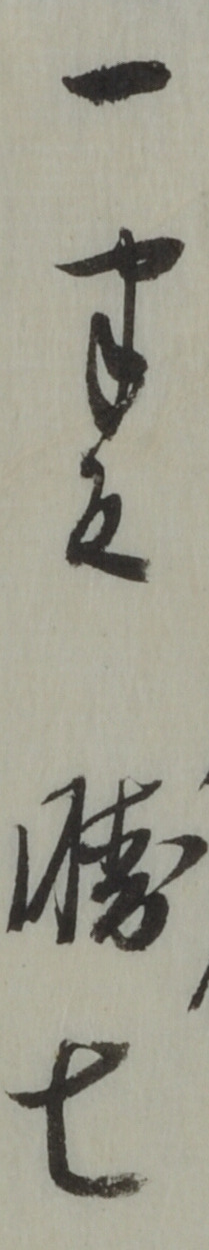一半反勝七
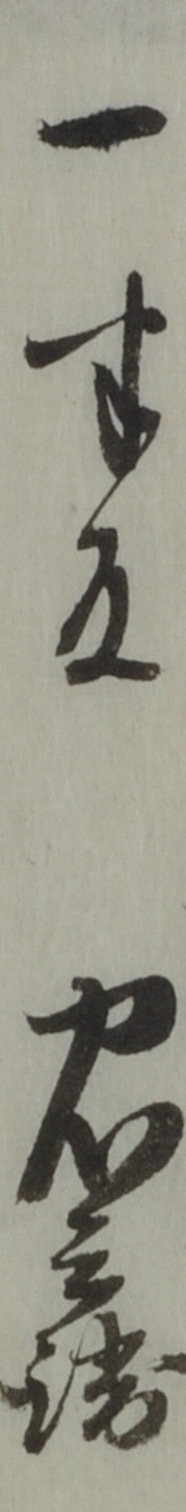一半反忠兵衛
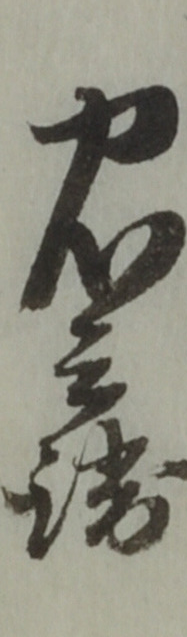茂兵衛
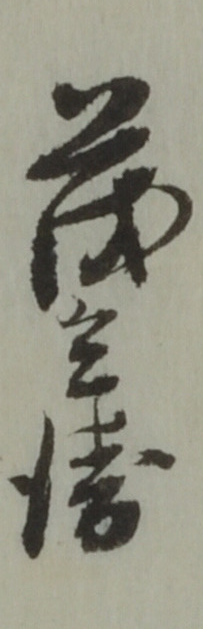茂兵衛
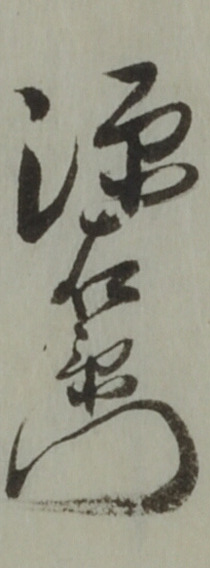源右衛門
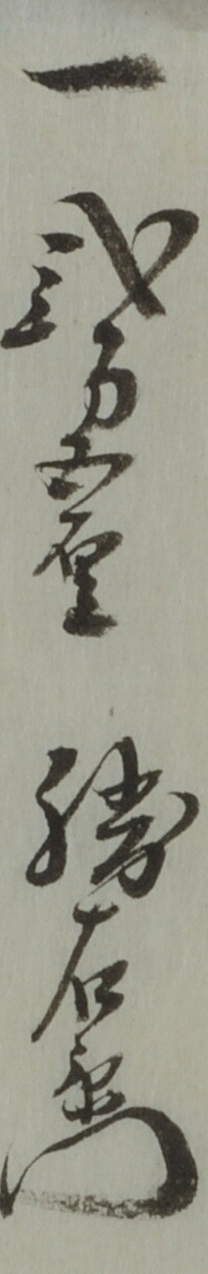一弐分五厘勝右衛門
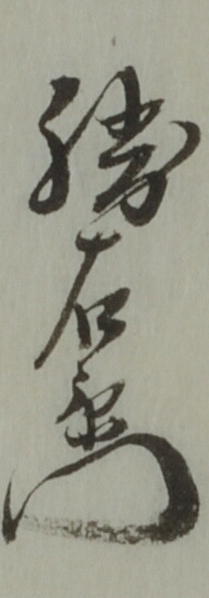源右衛門
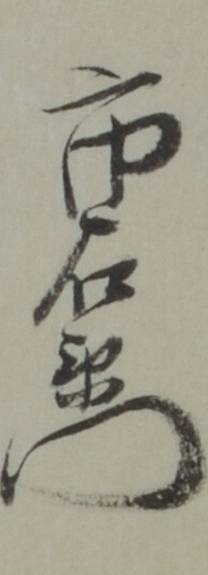源右衛門

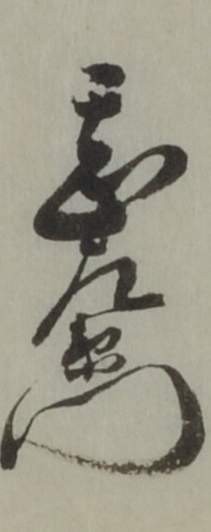甚左衛門
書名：融通割合帳
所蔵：伊那市立高遠町図書館・合同会社AMANE
